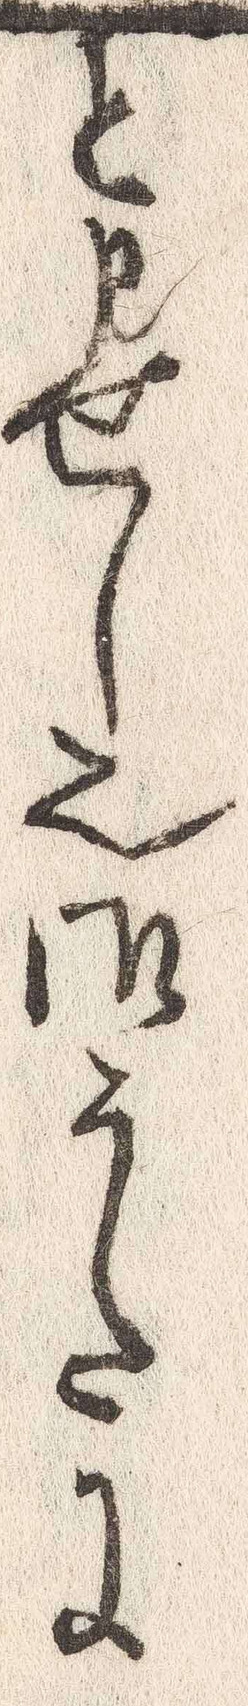と申せし也御うたに
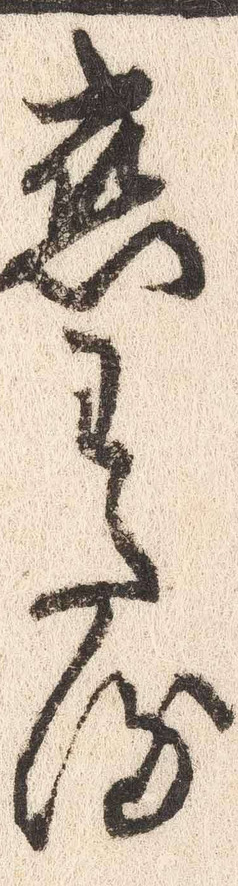恋わたる
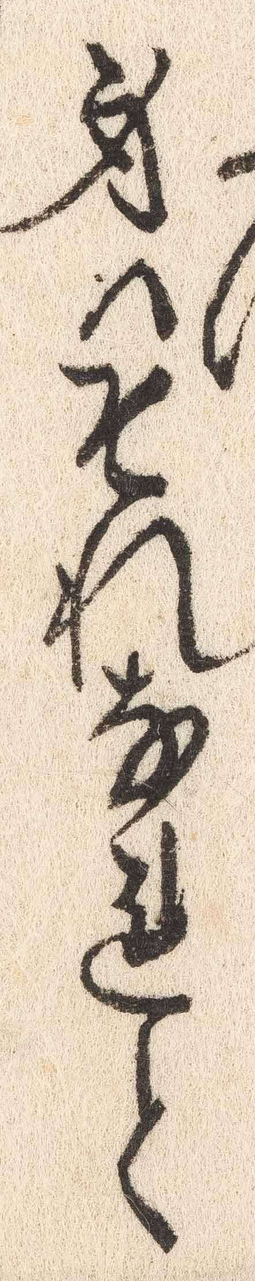身はそれなれと
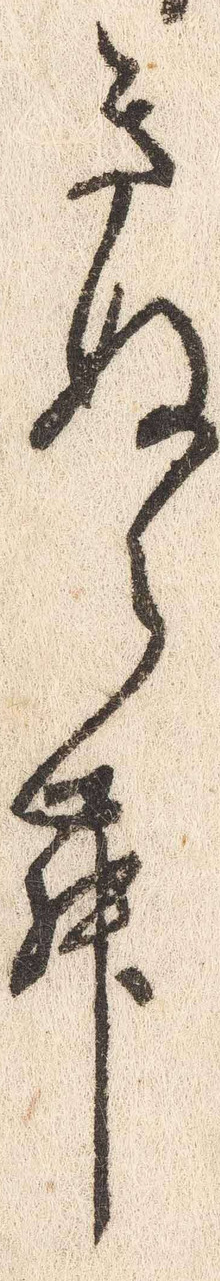きぬらむ

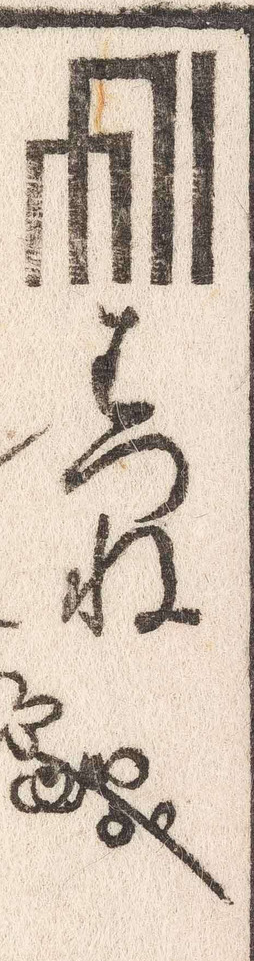はつね
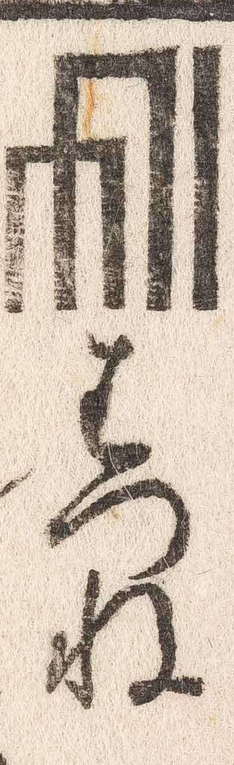はつね
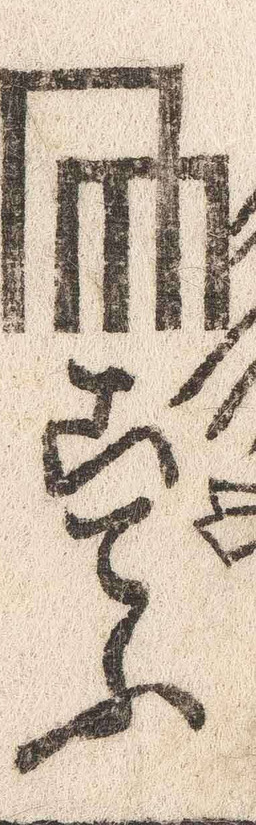こてふ

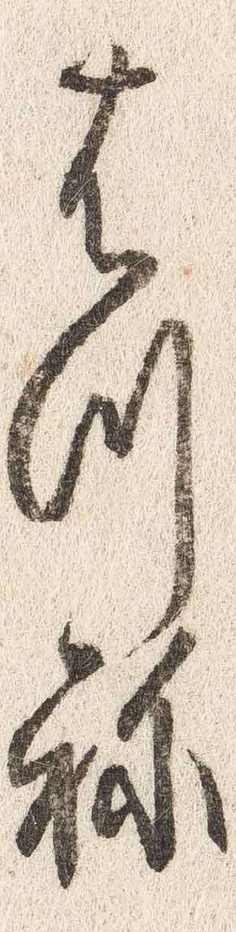はつね
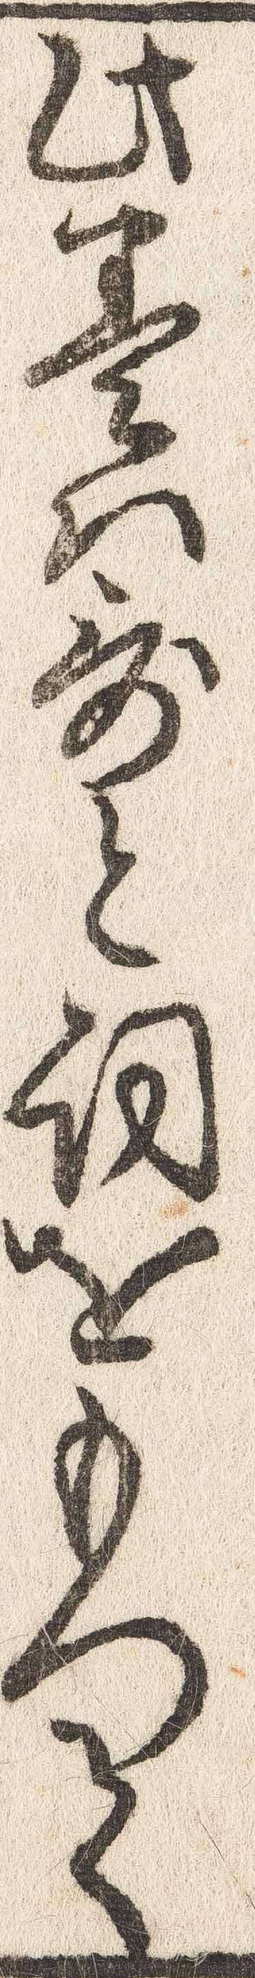此巻は歌と詞をもつて
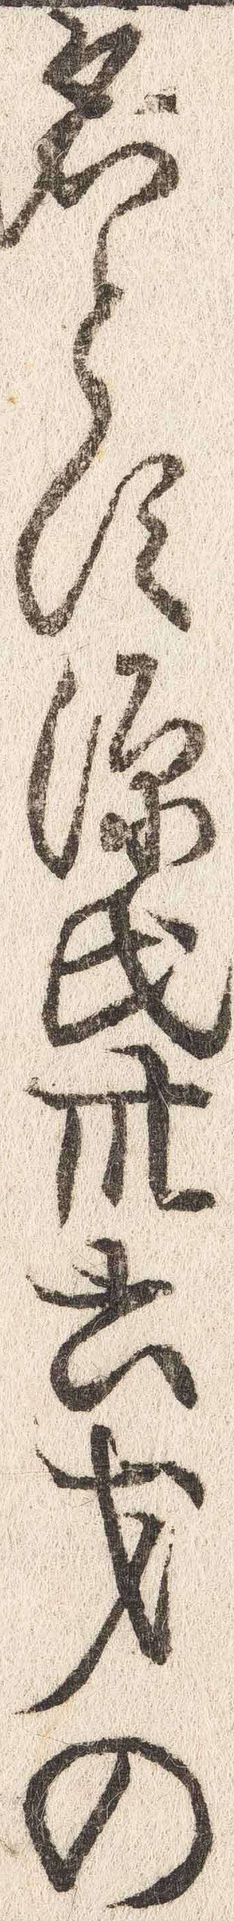名とす源氏卅六才の
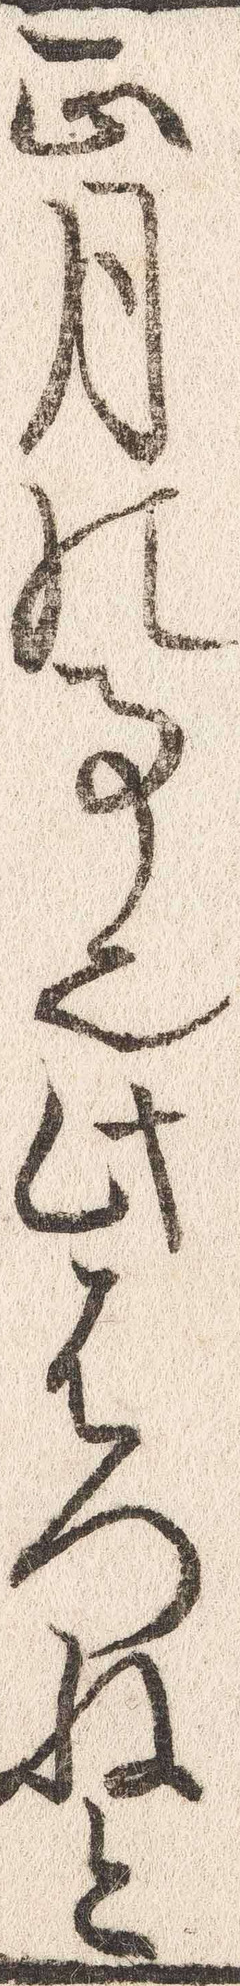正月の事也此はつねと
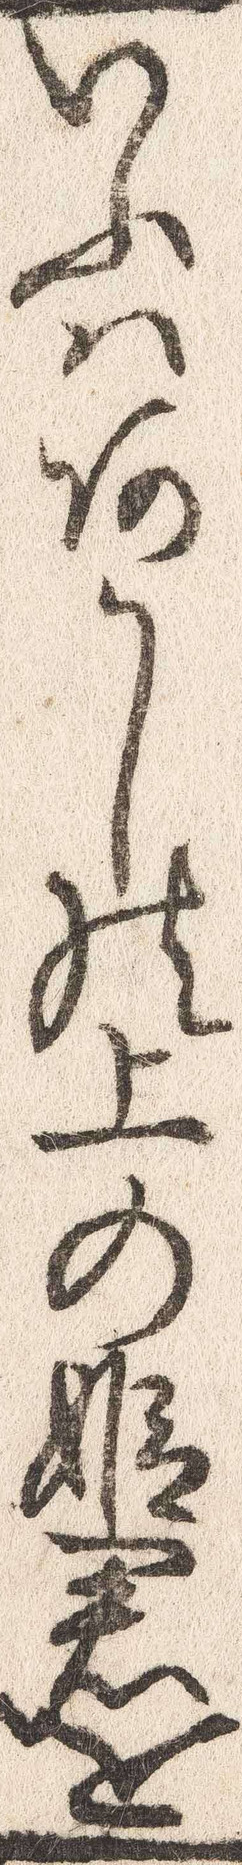いふはあかしの上の姫君を
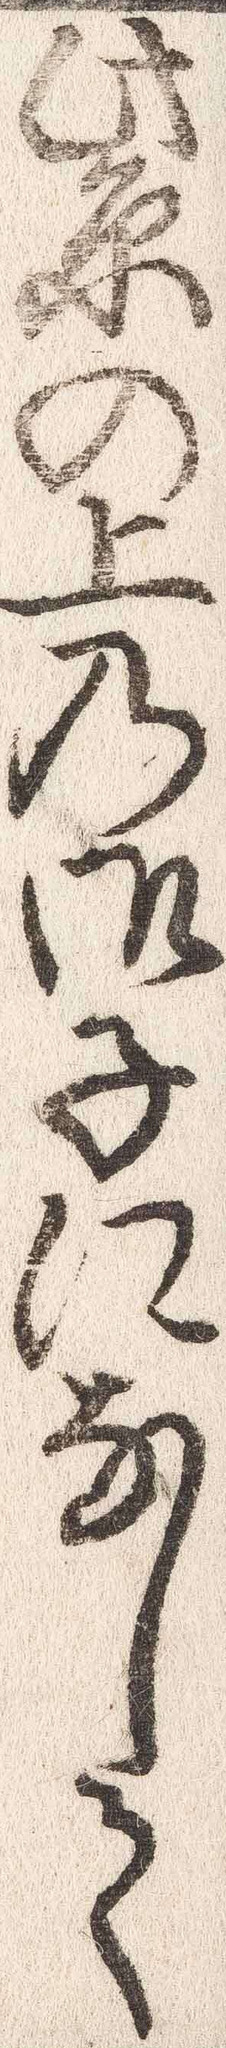紫の上の御子になして
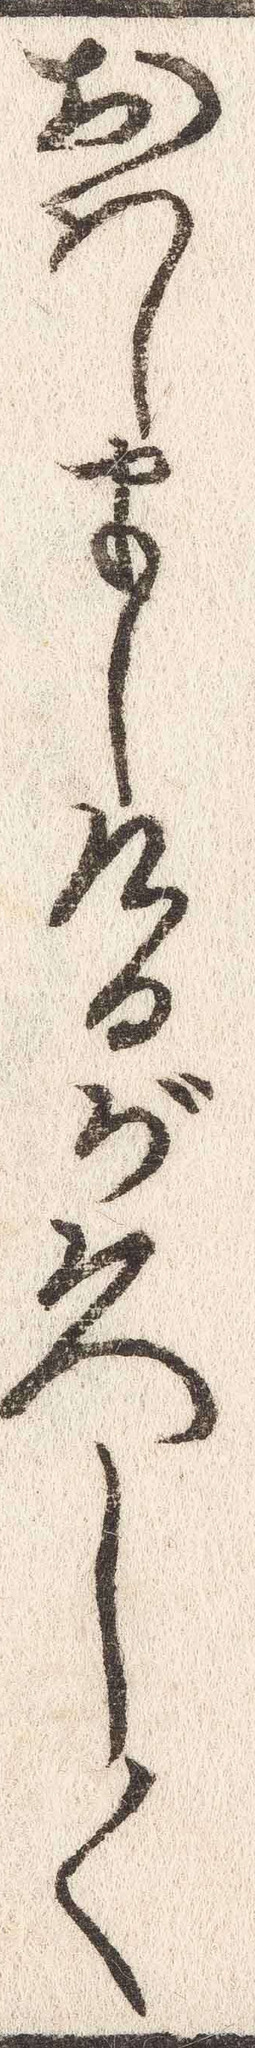おはしましけるが久しく
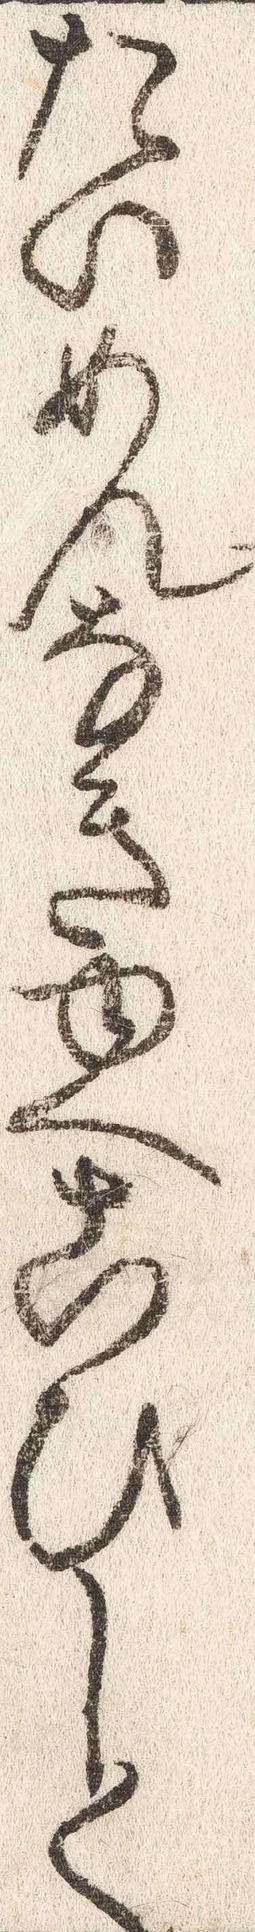たいめんなきゆへこひしく
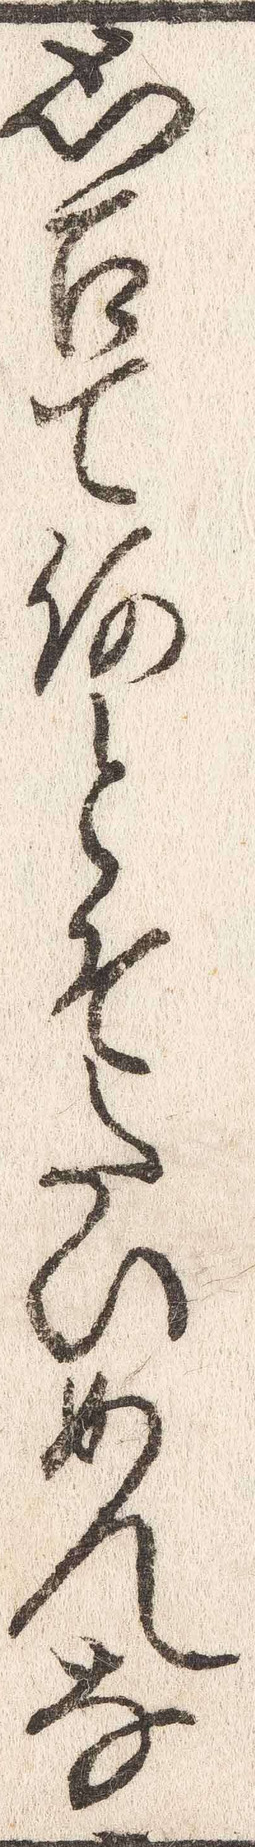思召て何とそたいめんな
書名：源氏物語
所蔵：東京学芸大学附属図書館 国文学研究資料館
